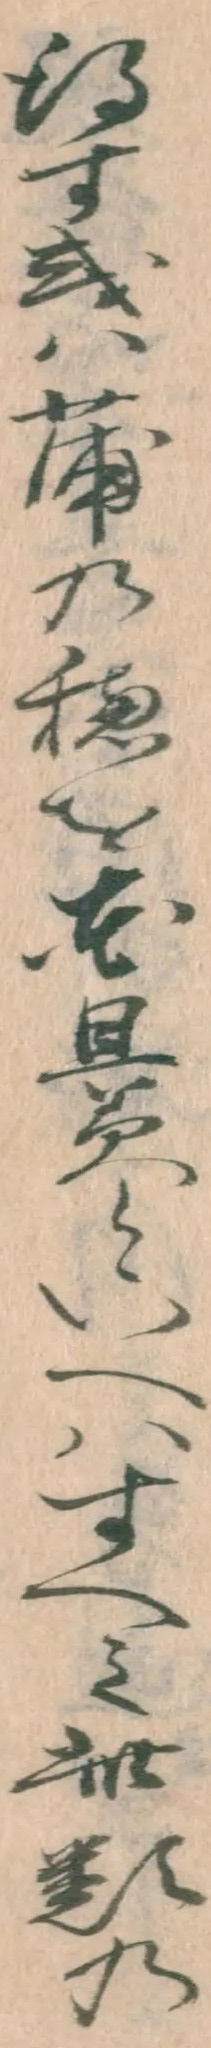得ず或は蒲の穂を花且美といへハすへて此類の
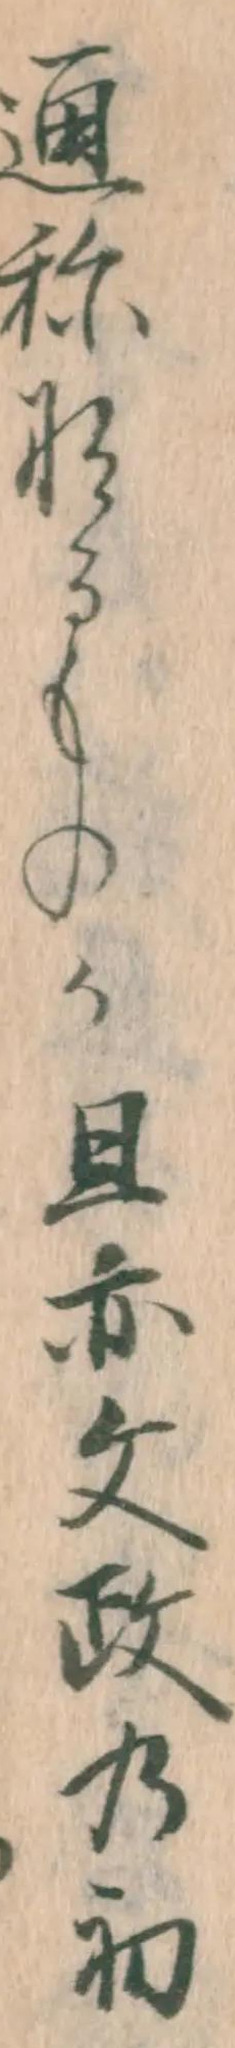通称なるものか且亦文政の初
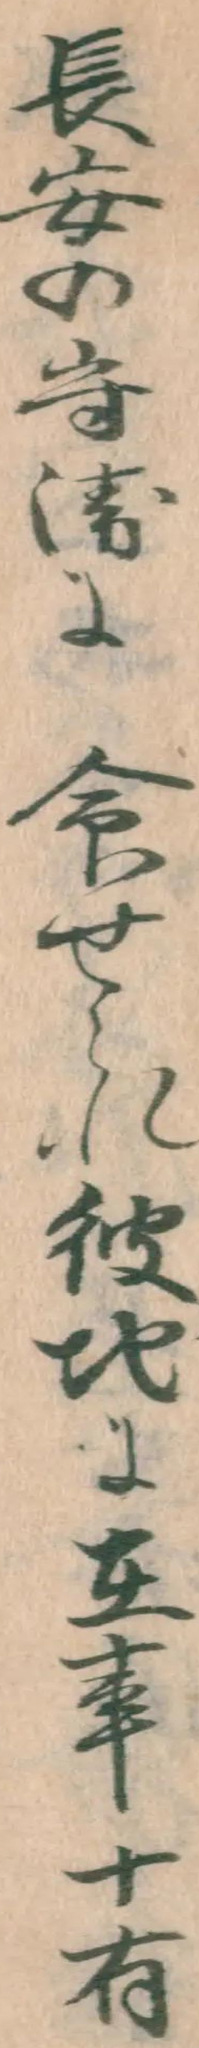長安の守衛に命せられ彼地に在事十有
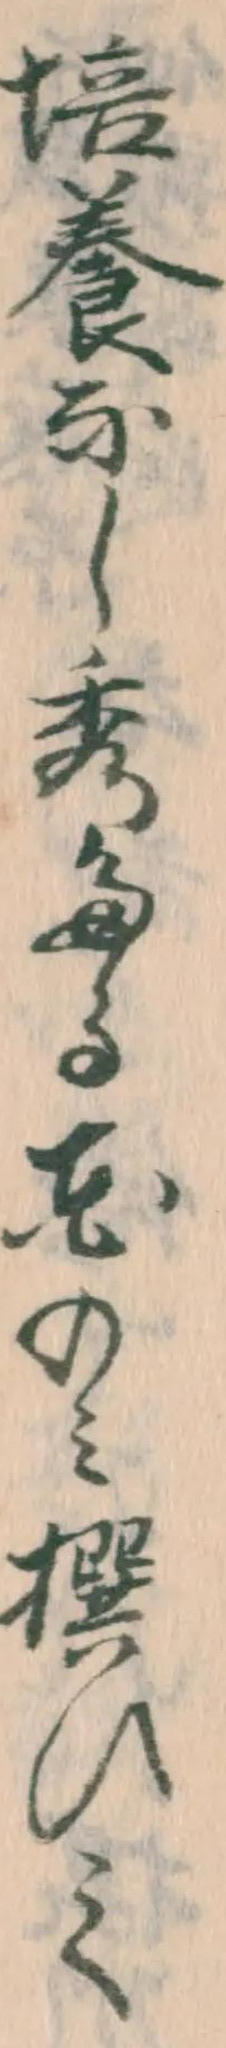培養なし秀たる花のミ撰ひて
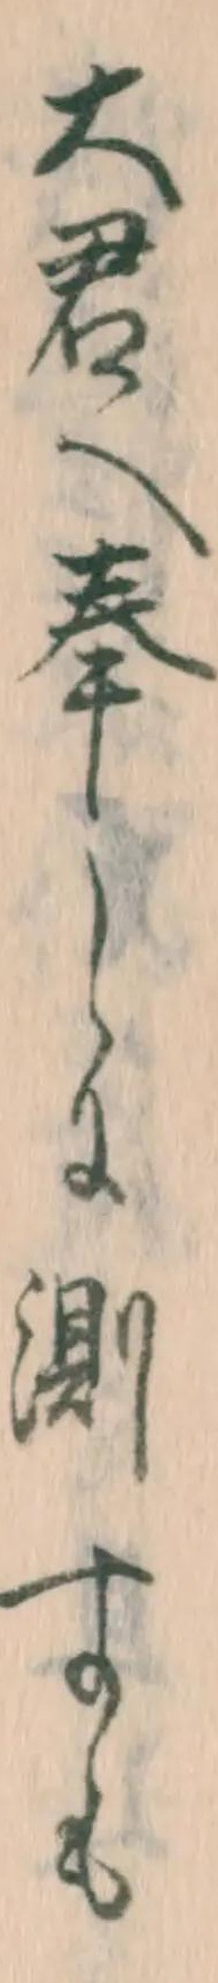大君へ奉しに測すも
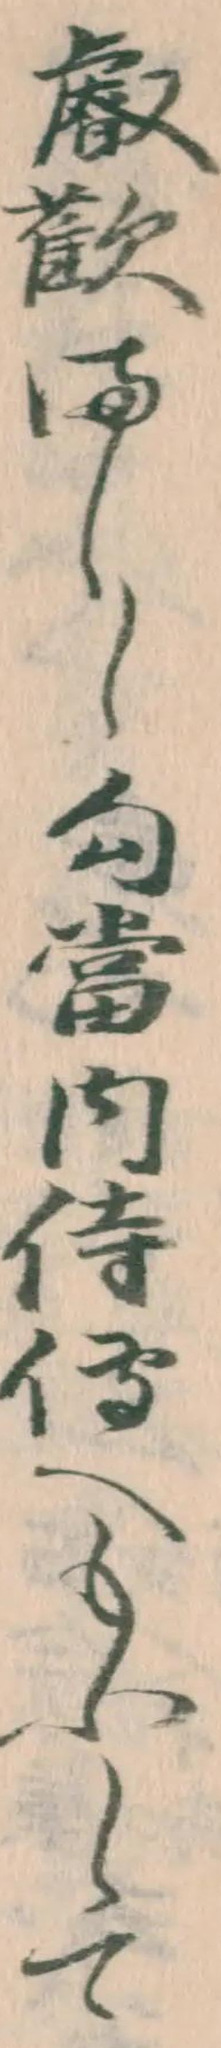叡歎おしかり勾当内侍伝へもふして
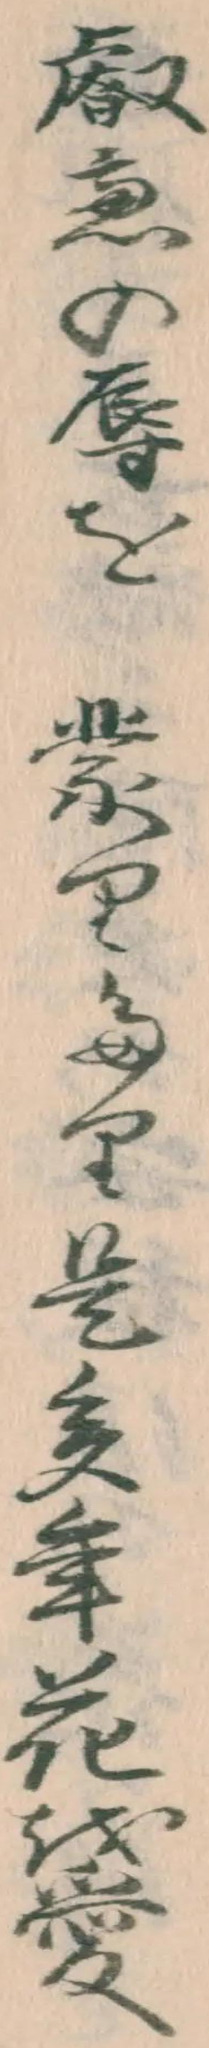叡慮の辱を蒙りたり是多年花を愛
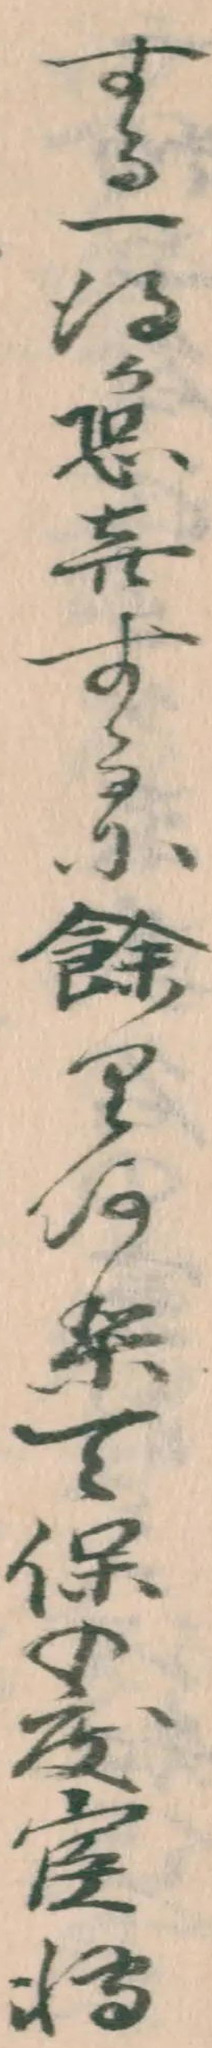する一得か恐喜するに余りあり天保の夏宦転
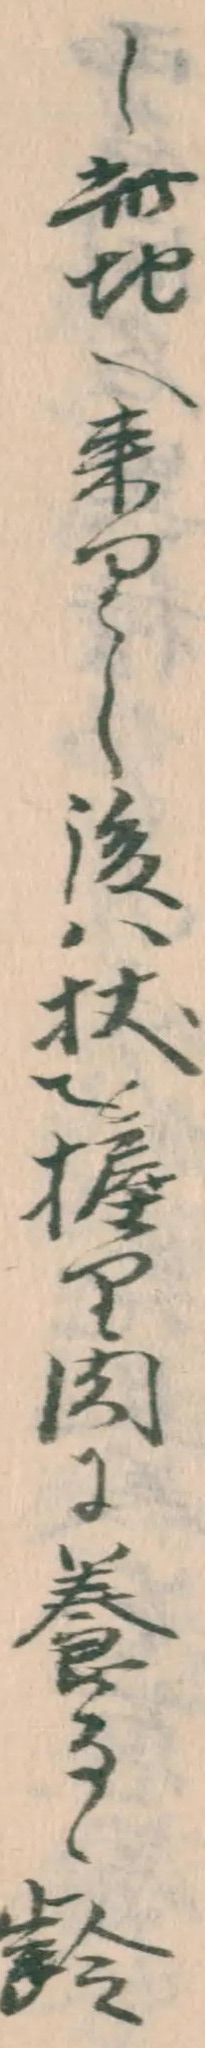し此地へ来りし後ハ杖を握り肉に養なく齢
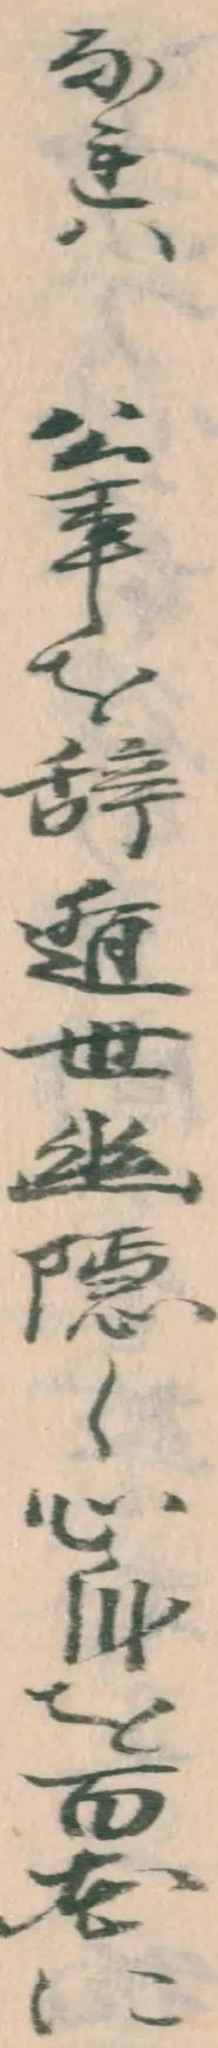なれハ公事を辞遁世幽隠し心身を百花に
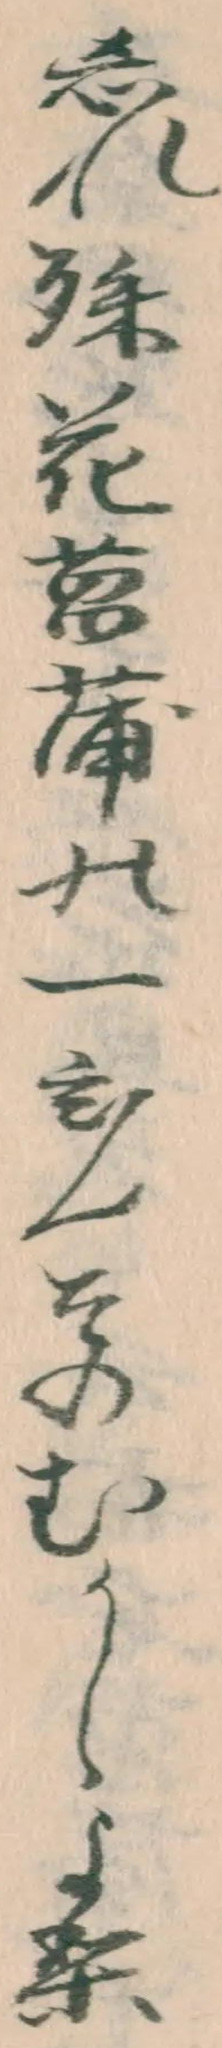忘れ殊花菖蒲の一ひんそのむかしより
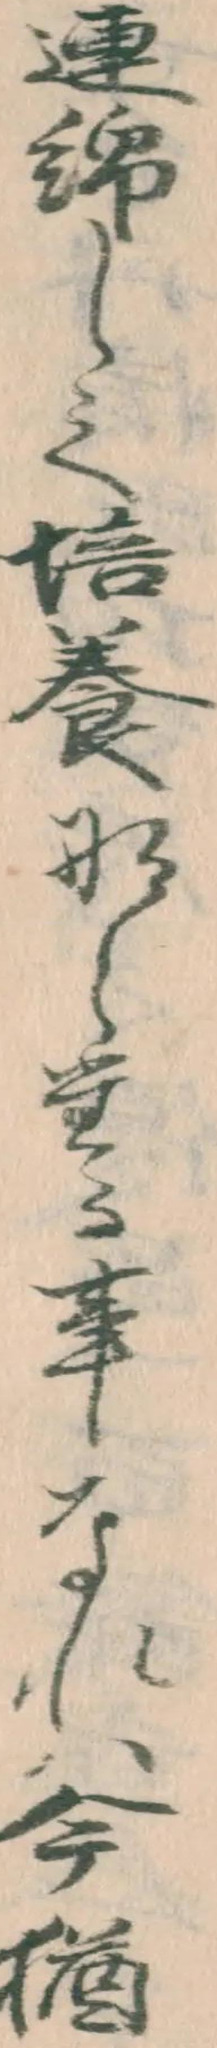連綿して培養なしたる事なれハ今猶
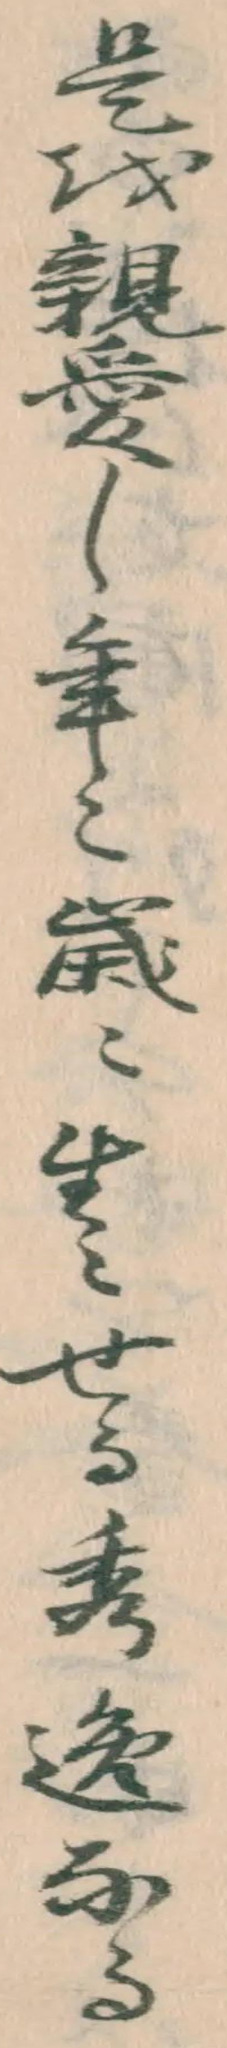是を親愛し年々歳々生々せる秀逸なる

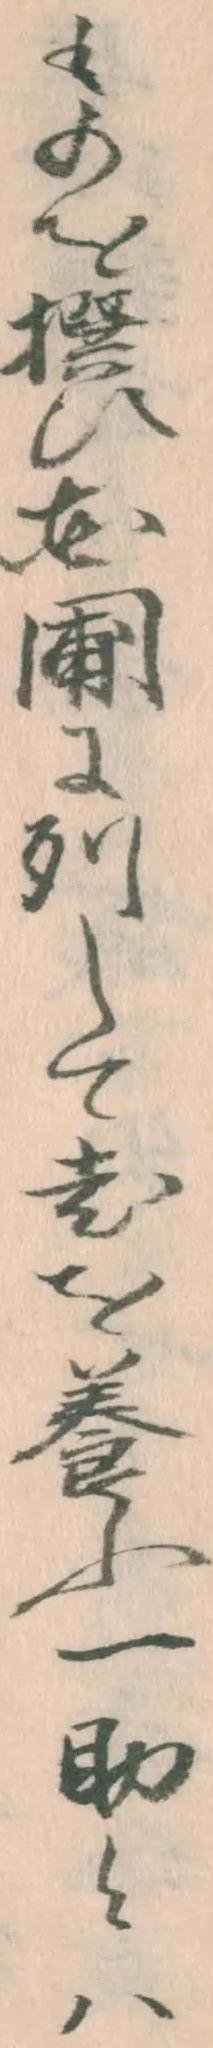ものを撰ひ花圃に列して老を養ふ一助とハ
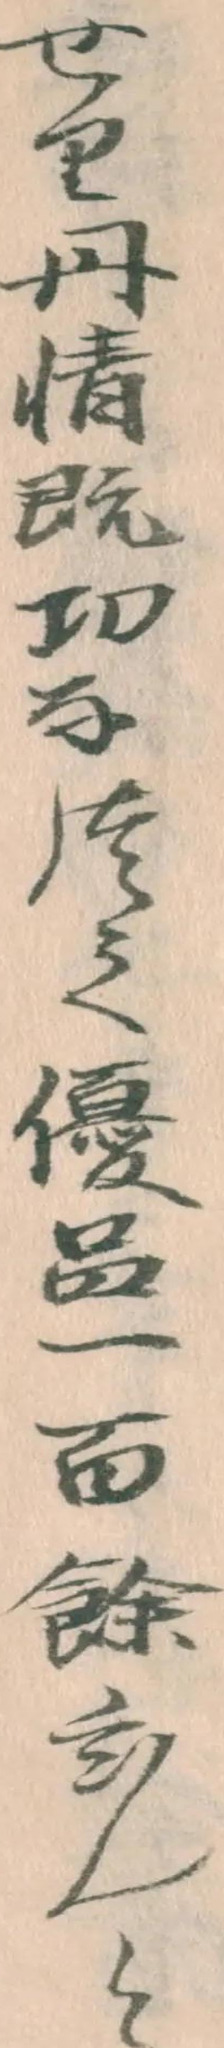せり丹精既功なつて優品一百余ひんと
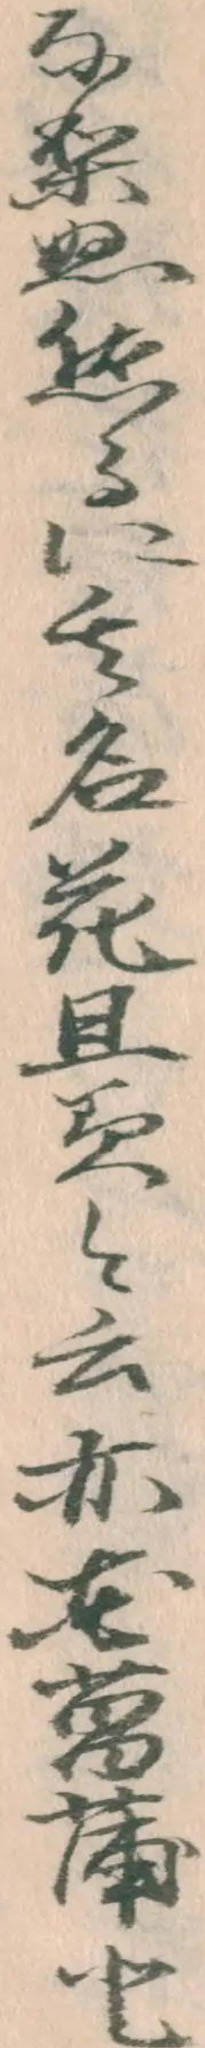なりぬ然るに其名花且美と云亦は花菖蒲と
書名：花菖培養録
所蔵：国立国会図書館 National Diet Library, JAPAN
